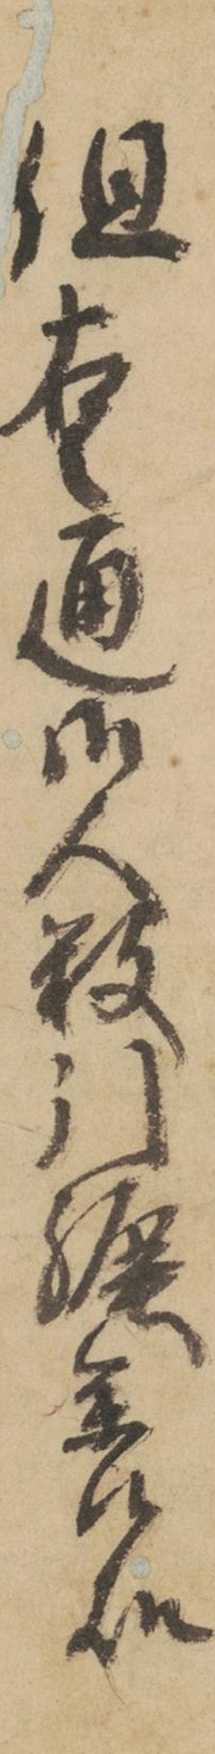但右之通御人数引纏参候処
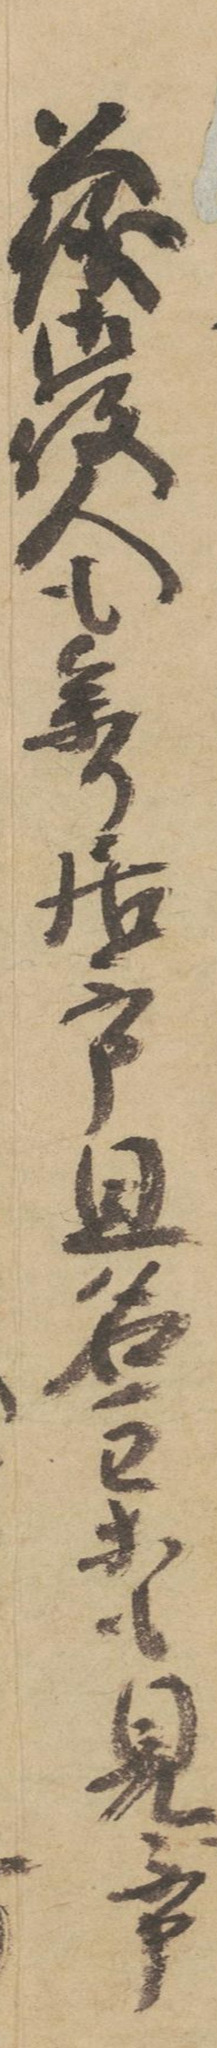公儀御役人も参り居不申且名主等も見へ不申
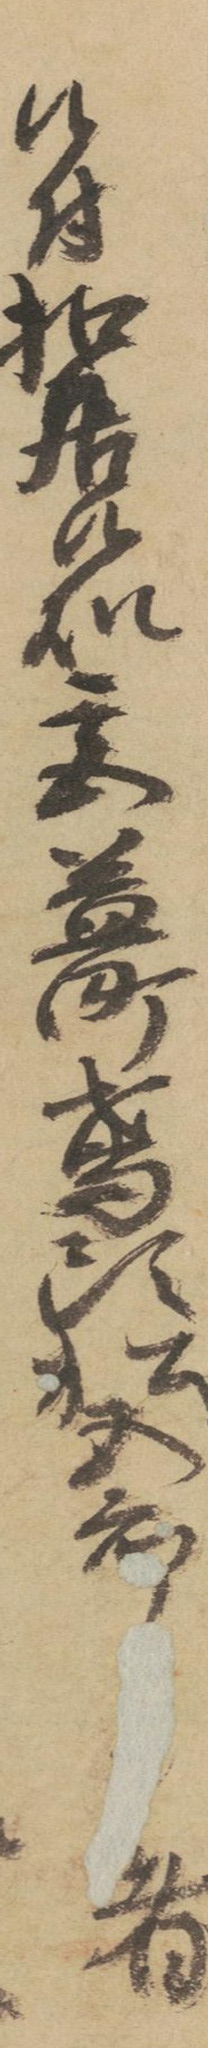候付扣居候処宮益町鳶頭松五郎者
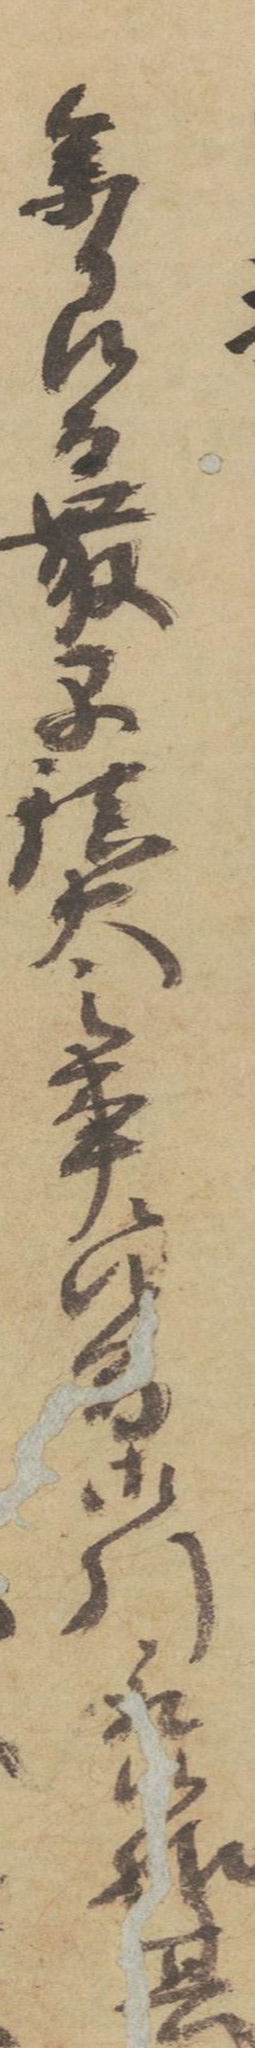参り候而最早鎮火之事二候間御引取候様其
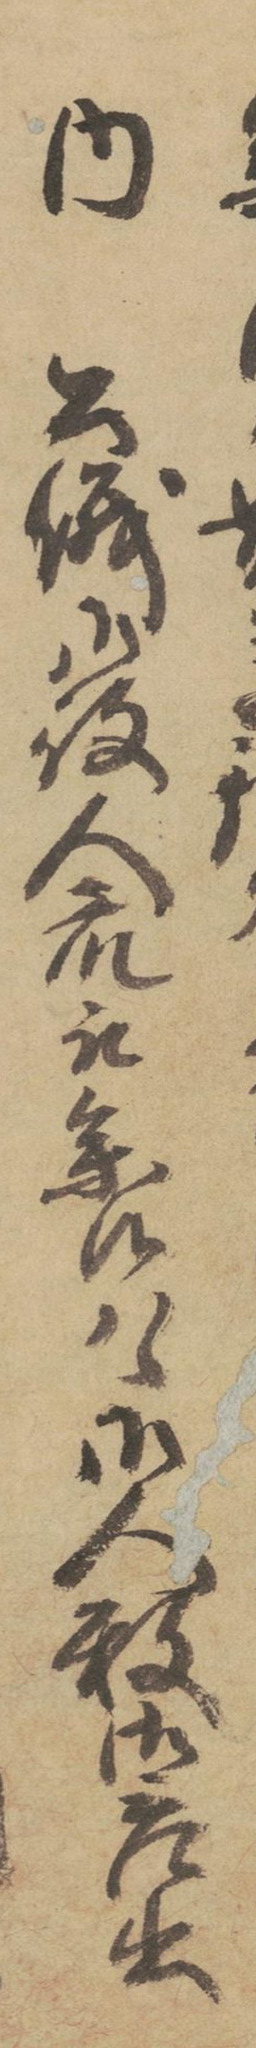内公儀御役人衆被参候ハゝ御人数御差出
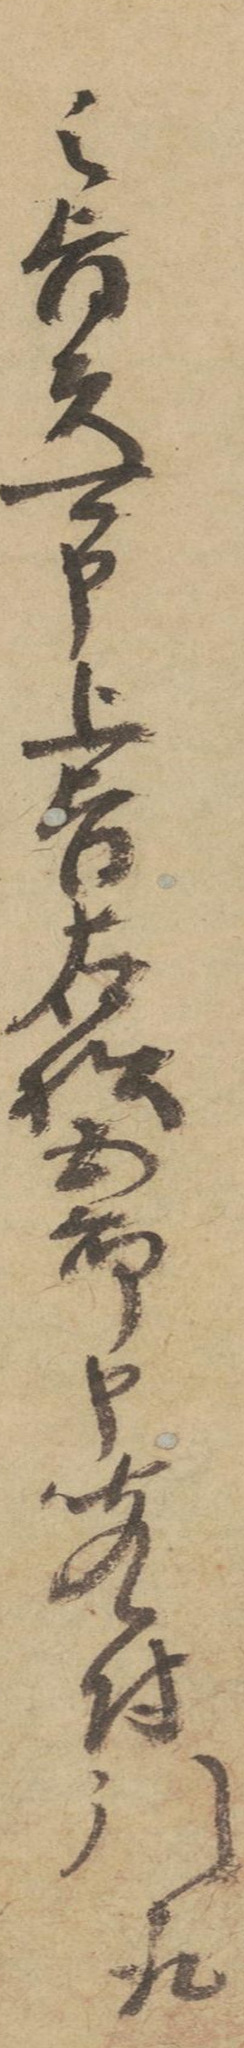之旨は可申上旨右松五郎申聞候付引取
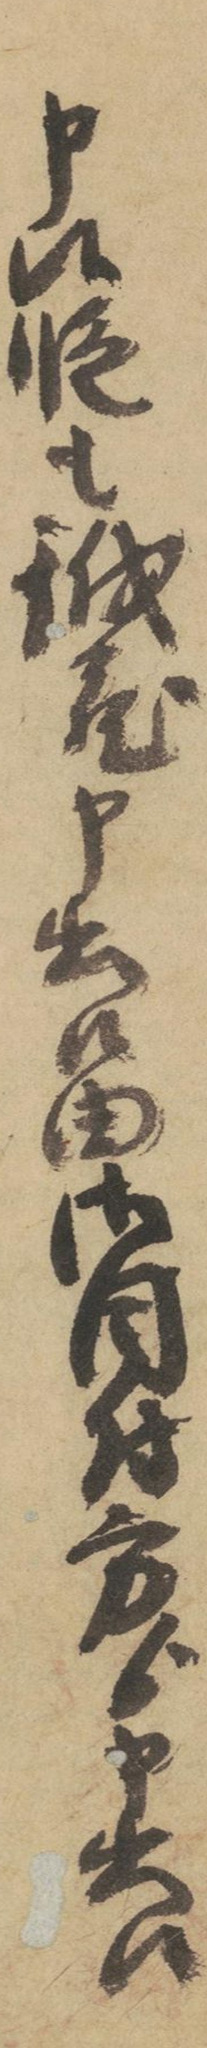申候段も鋨蔵申出候由御目付方ゟ申出候
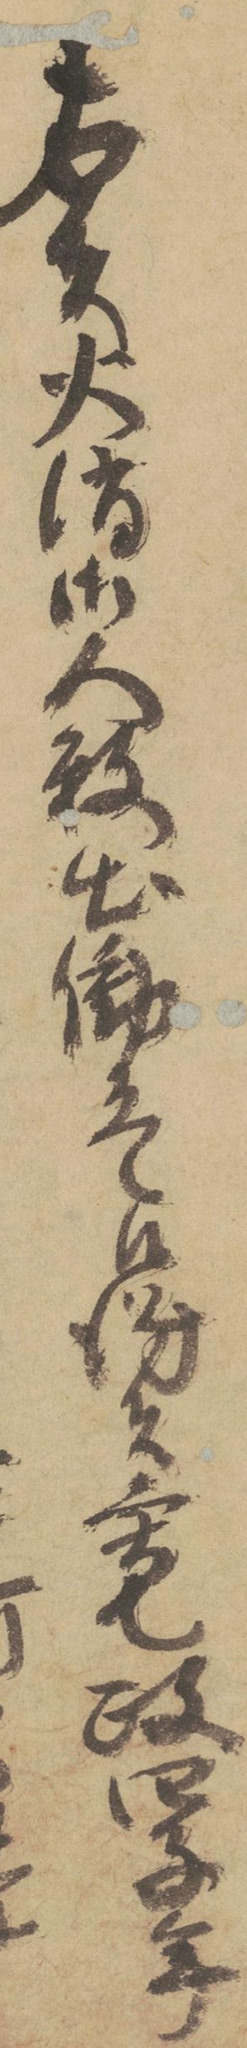右者火消御人数出働有之候汾は寛政四子年
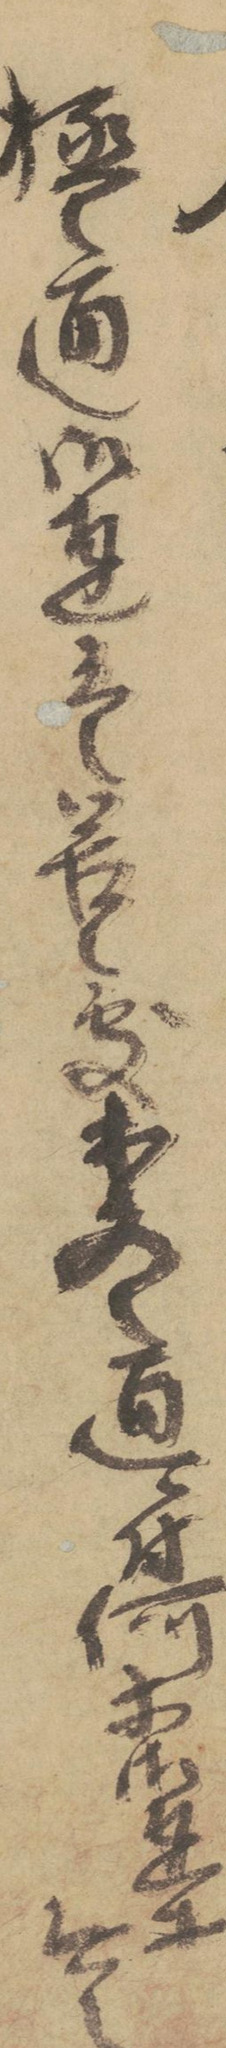極之通御達有之筈候処本文之通二付何等御達等無之
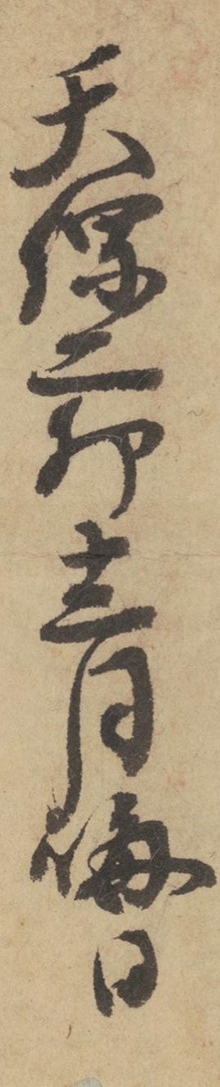天保二卯十二月晦日
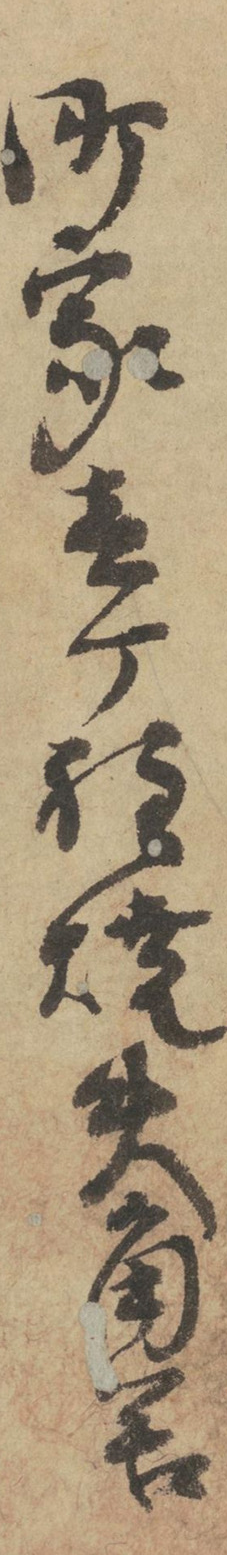町家壱丁程焼失角谷
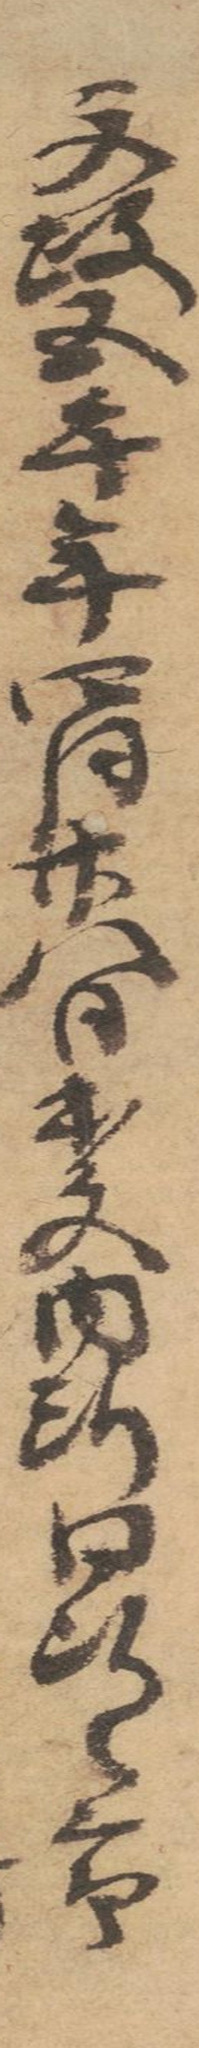文政五午年四月廿八日本文内所同断之節
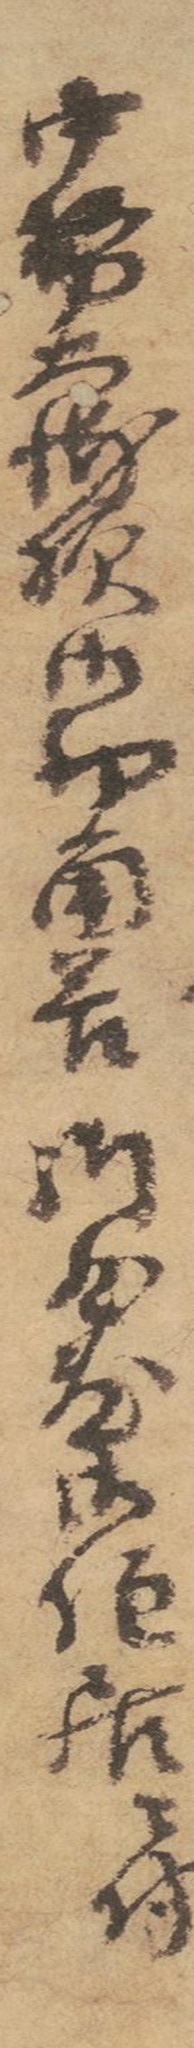中務大輔様御切角谷御屋敷御住居二付
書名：[紀州藩災害記録]
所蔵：東京大学地震研究所図書室 Earthquake Research Institute Library, The University of Tokyo, JAPAN
